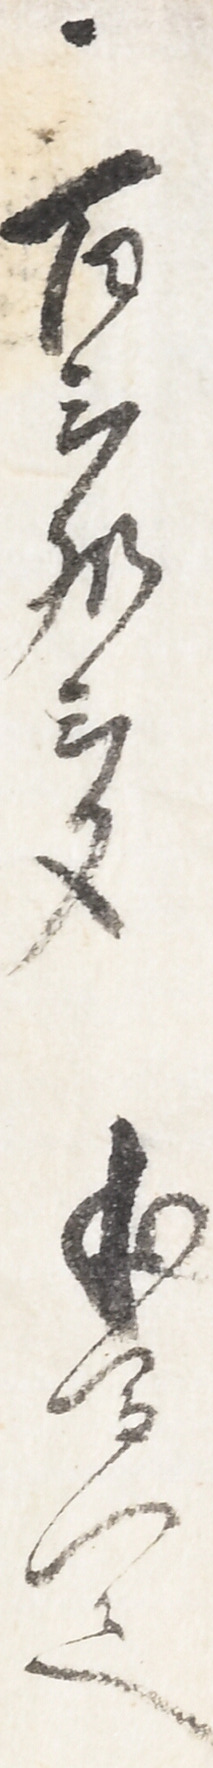一百三拾壱文本馬壱疋

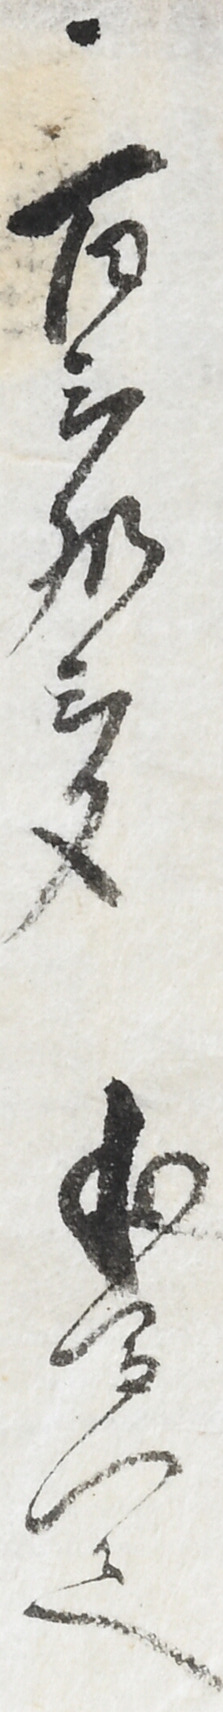一百三拾三文本馬一疋
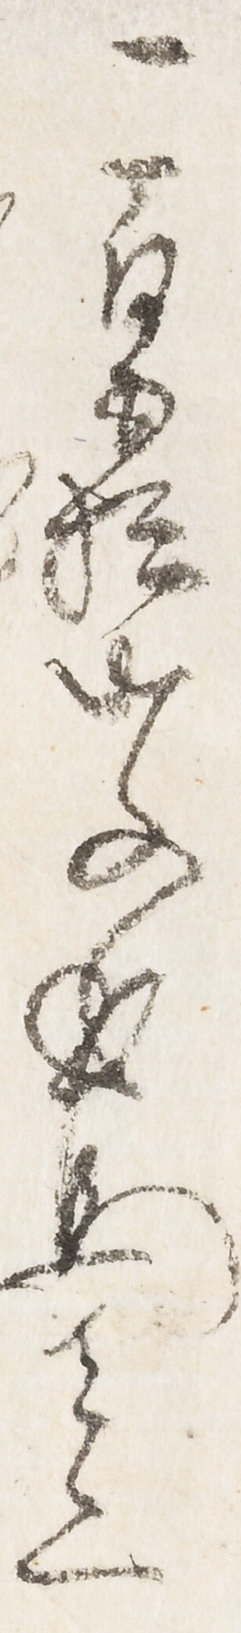一百五拾弐文本馬壱疋
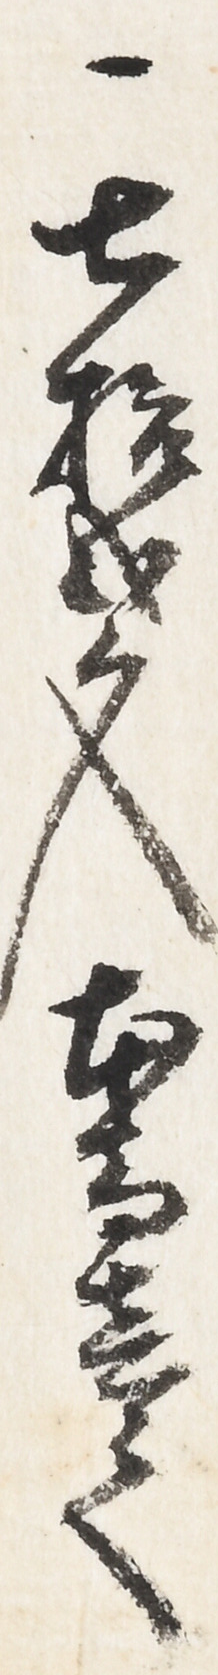一七拾弐文本馬壱疋
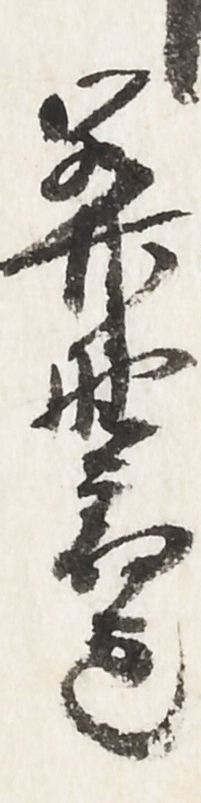駒木野宿迄
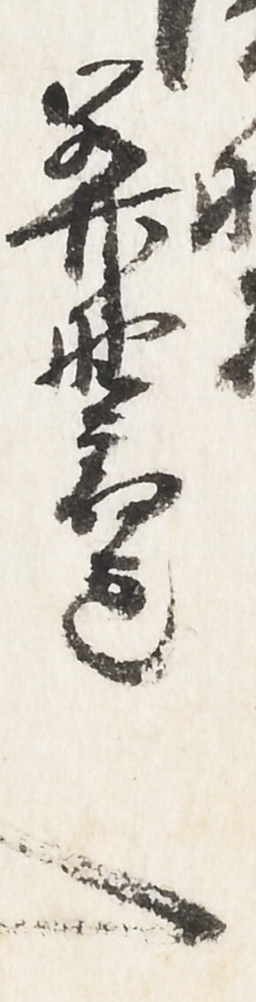駒木野宿迄

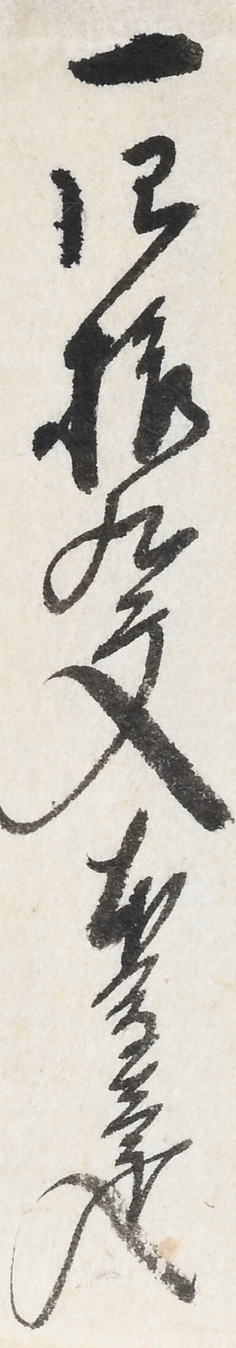一四拾九文本馬壱疋

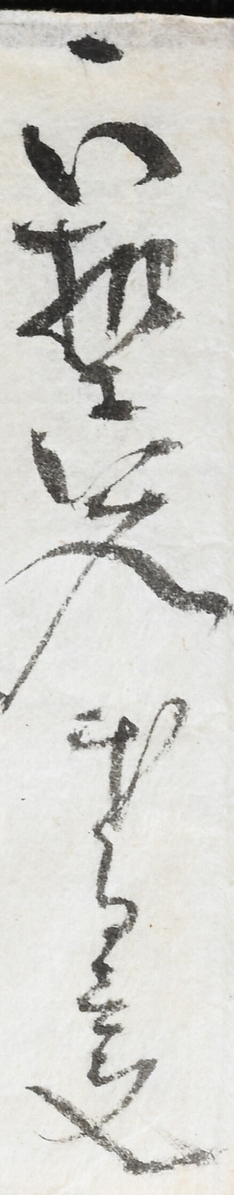一八拾壱文本馬壱疋
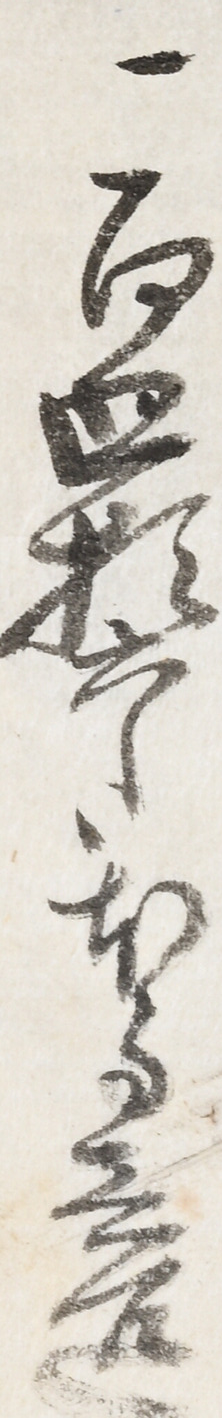一百四拾六文本馬壱疋
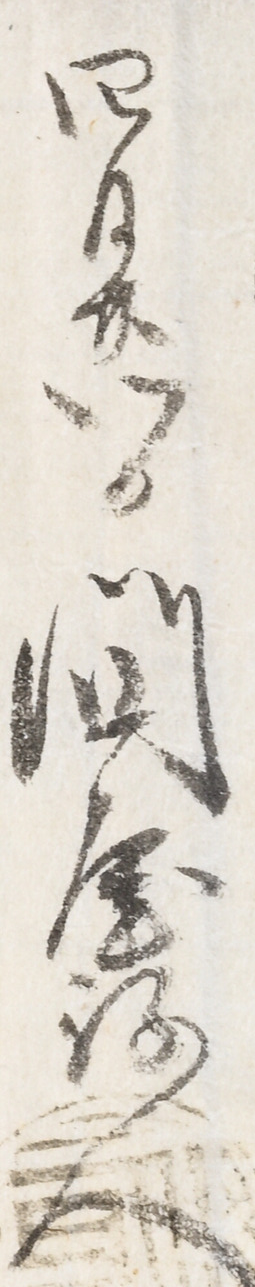四月廿八日問屋役人印

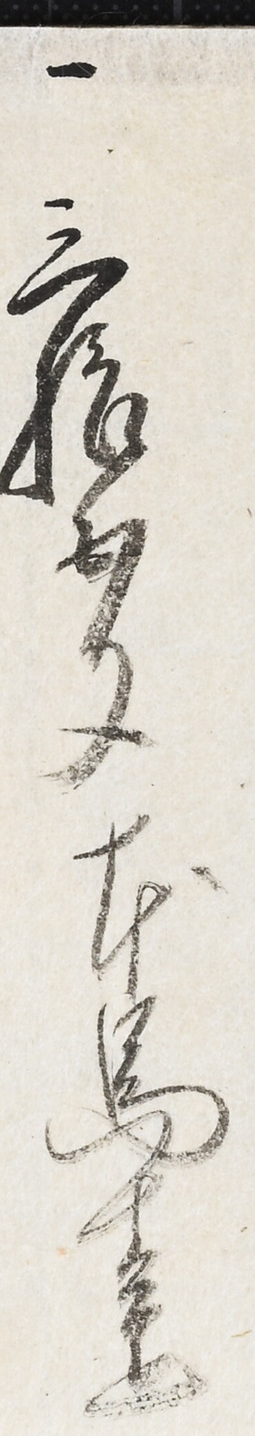一三拾五文本馬壱疋
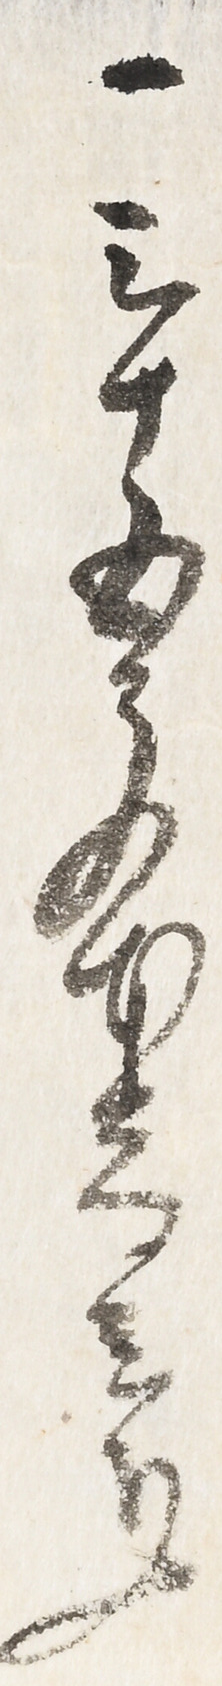一三十五文本馬壱疋

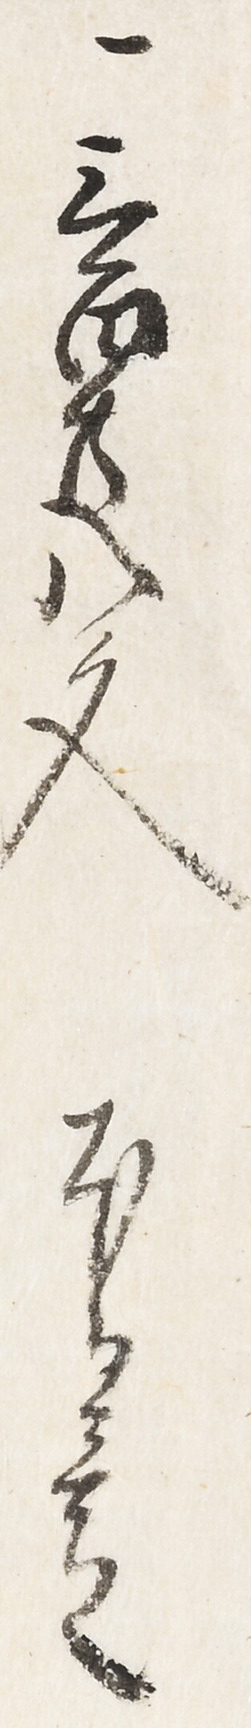一三百廿八文本馬壱疋

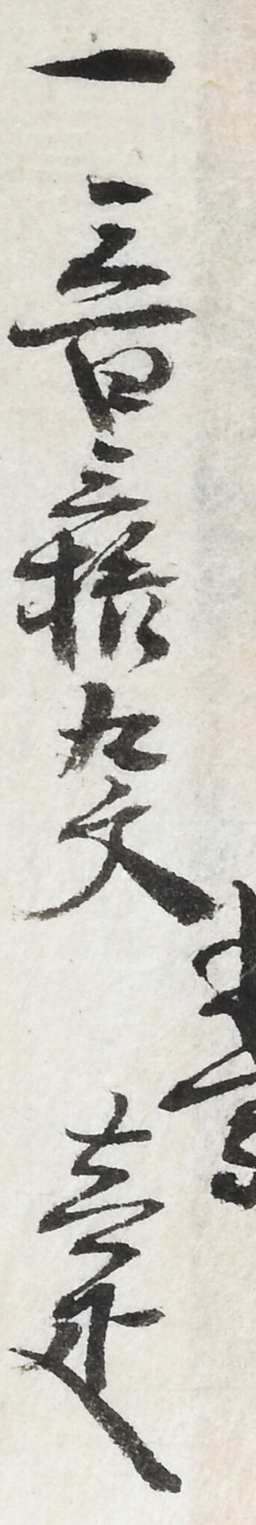一三百参拾九文壱疋
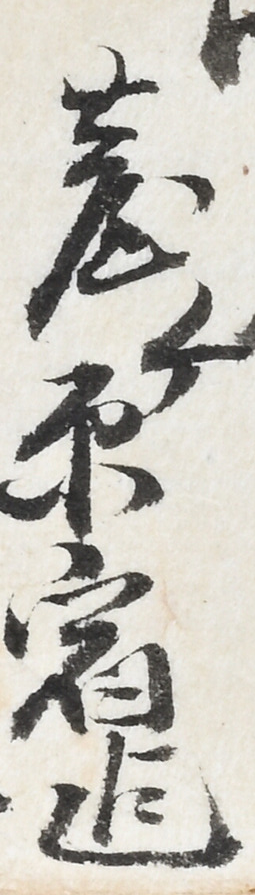台ヶ原宿迄
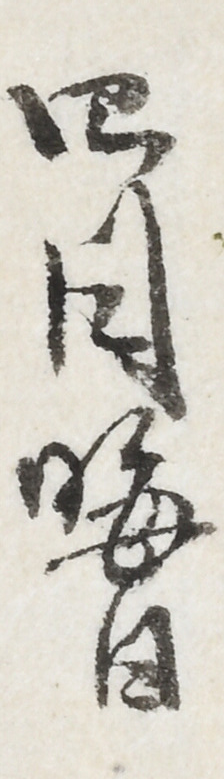四月晦日
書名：甲州通宿々駄賃払帳
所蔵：伊那市立高遠町図書館・合同会社AMANE
